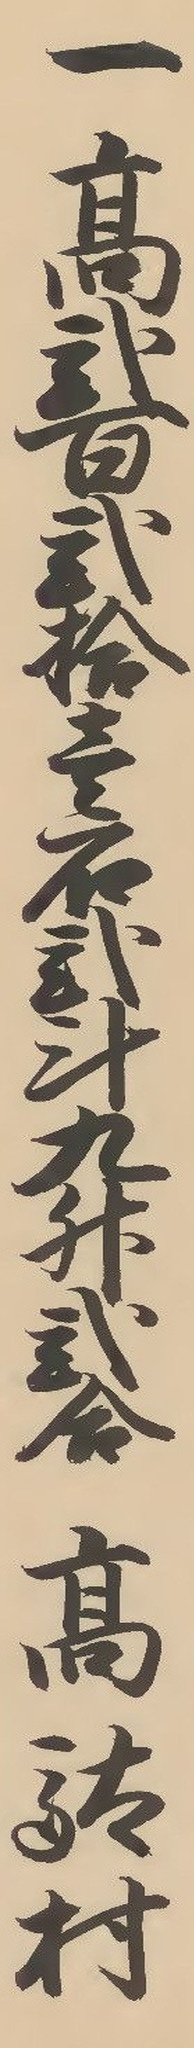一髙弐百弐拾壱石弐斗九升弐合髙駄村

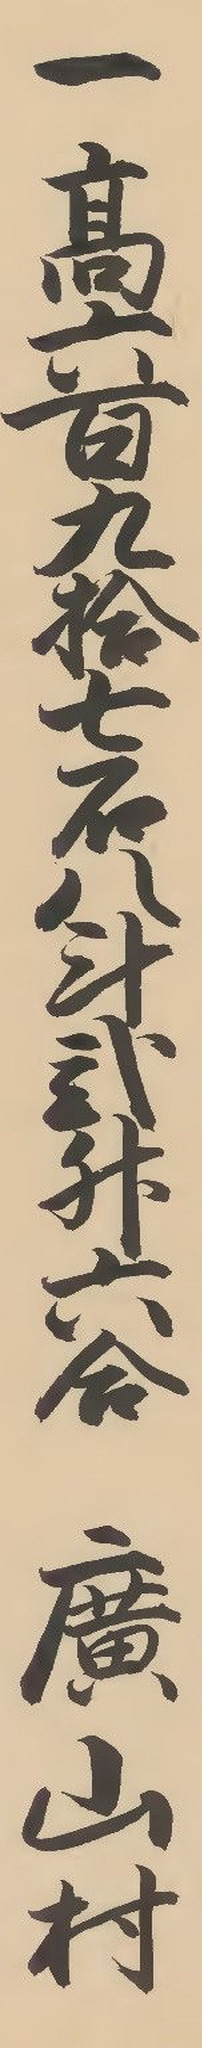一髙六百九拾七石八斗弐升六合廣山村
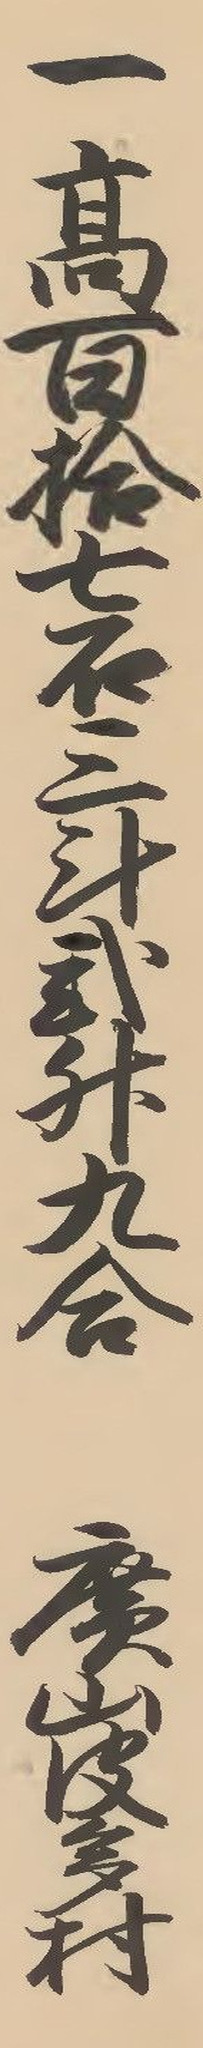一髙百拾七石三斗弐升九合廣山皮多村
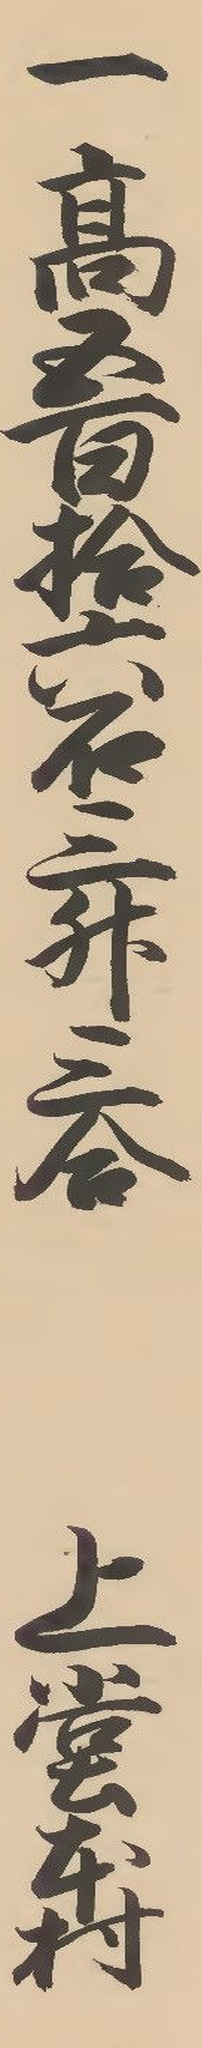一髙五百拾六石三升三合上堂本村
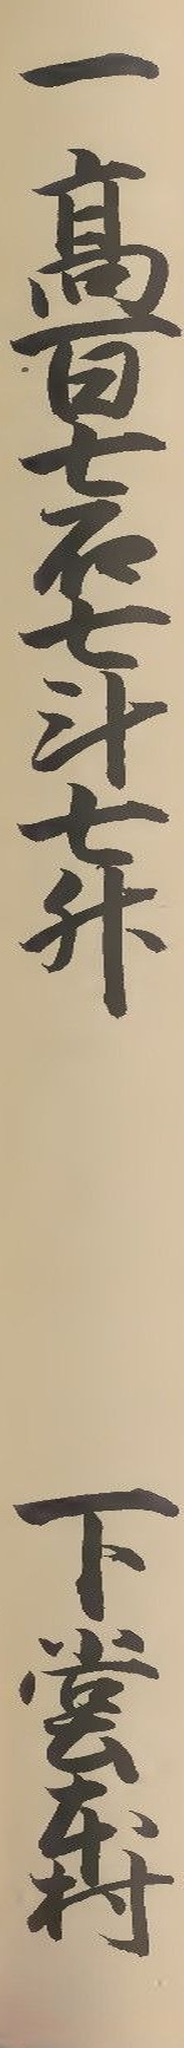一髙百七石七斗七升下堂本村
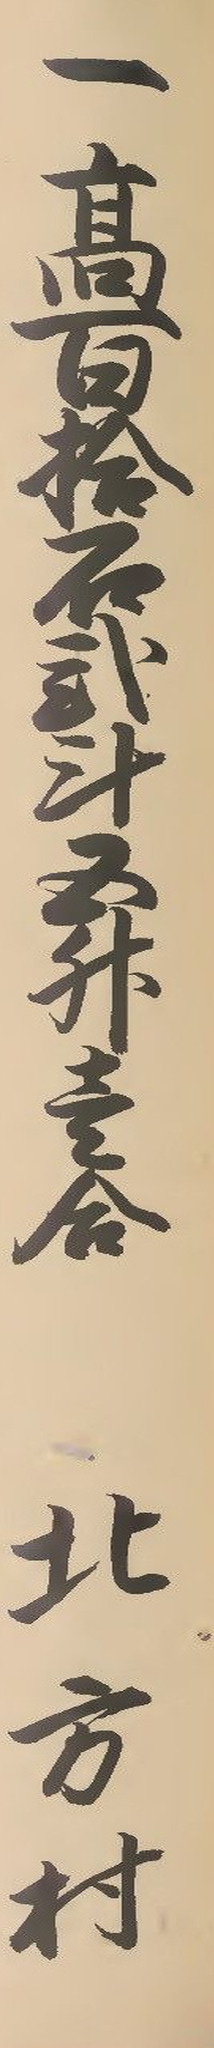一髙百拾石弐斗五升壱合北方村
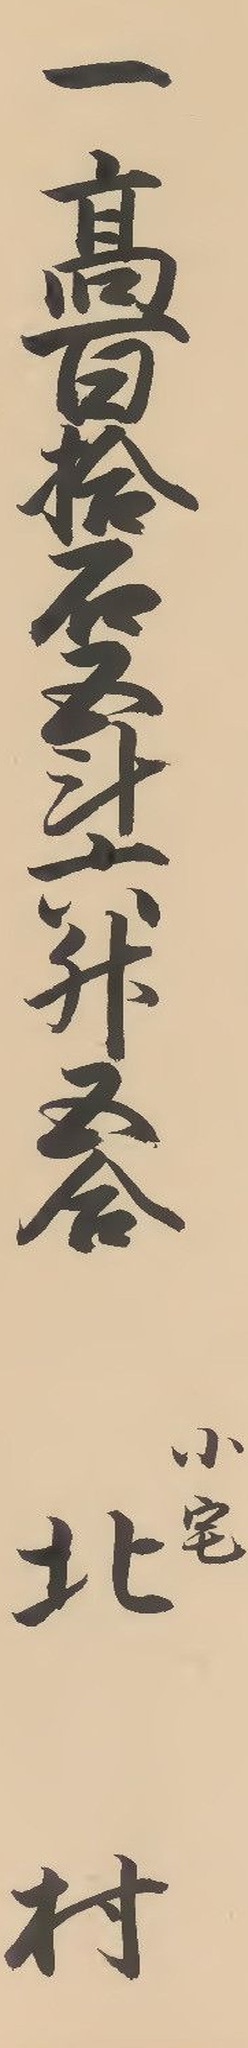一髙百拾石五斗六升五合北村
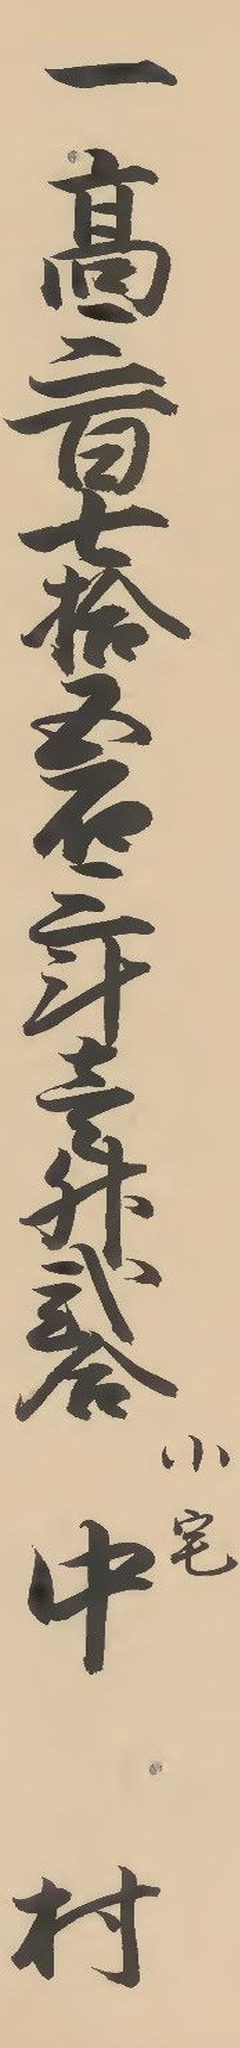一髙三百七拾五石三斗壱升弐合中村
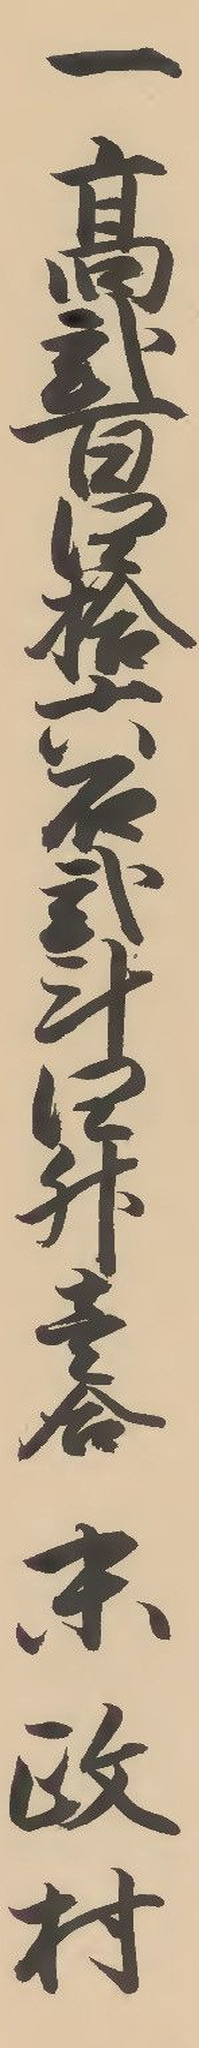一髙弐百四拾六石弐斗四升壱合末政村

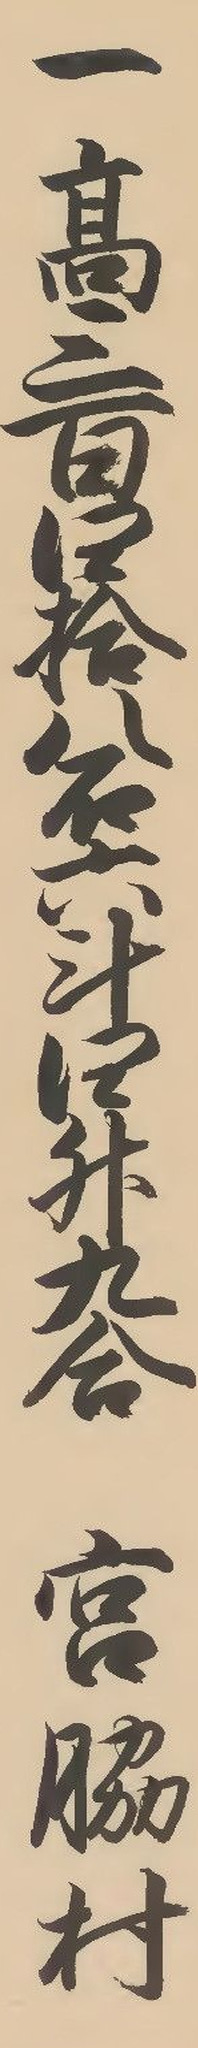一髙三百四拾八石六斗四升九合宮脇村
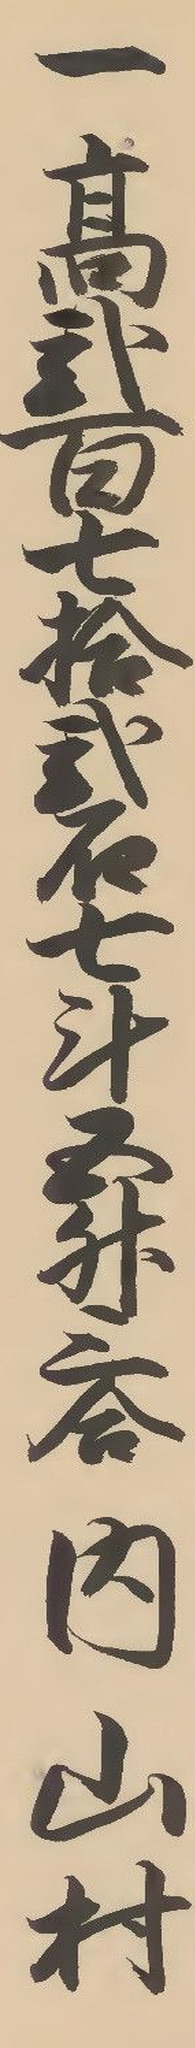一髙弐百七拾弐石七斗五升三合内山村
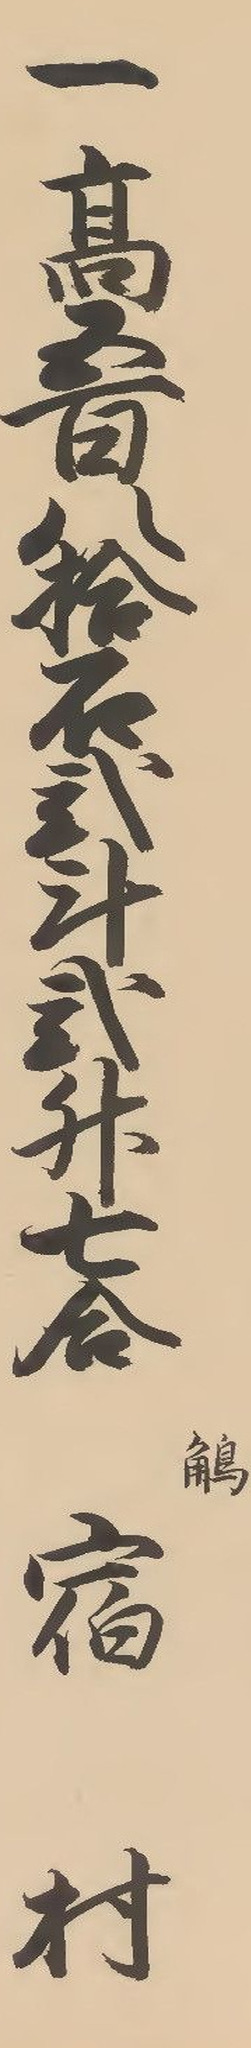一髙五百八拾石弐斗弐升七合宿村
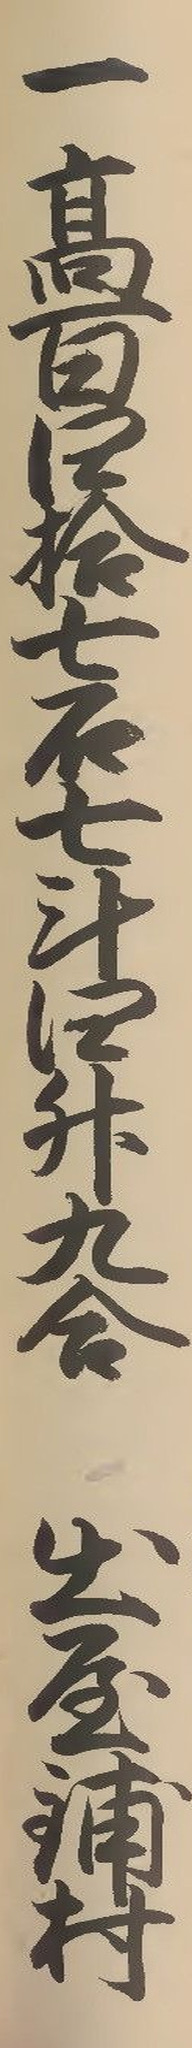一髙百四拾七石七斗四升九合出屋鋪村
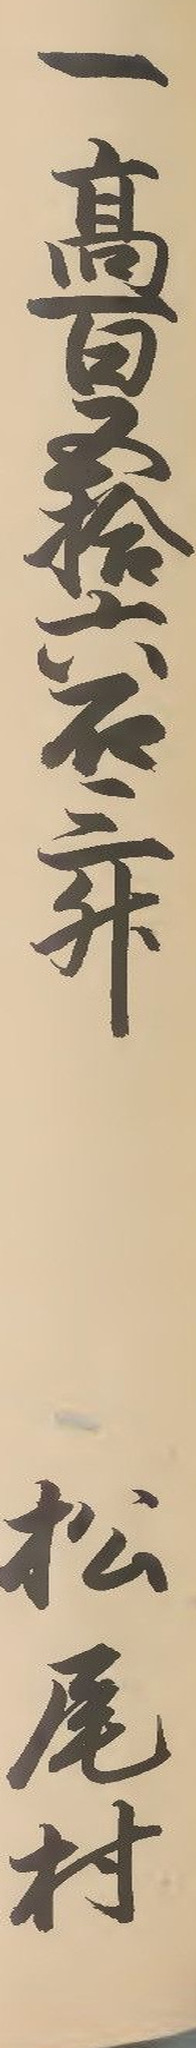一髙百五拾六石三升松尾村
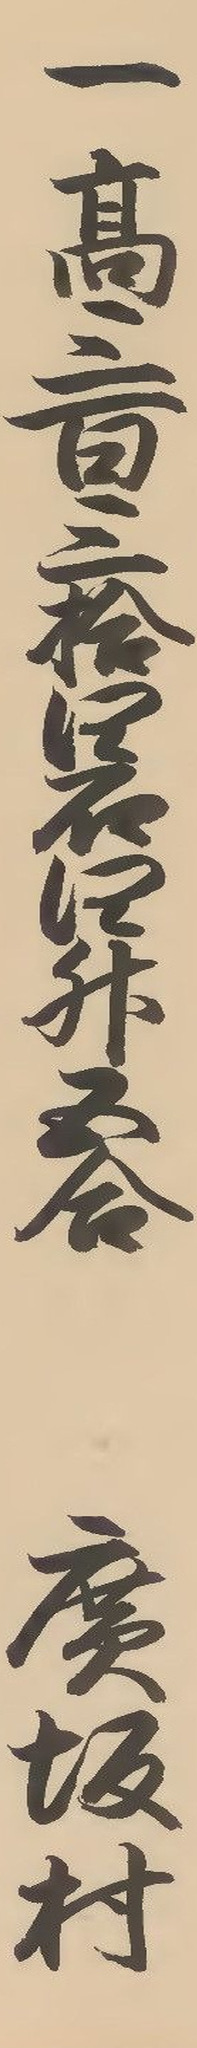一髙三百三拾四石四升五合廣坂村
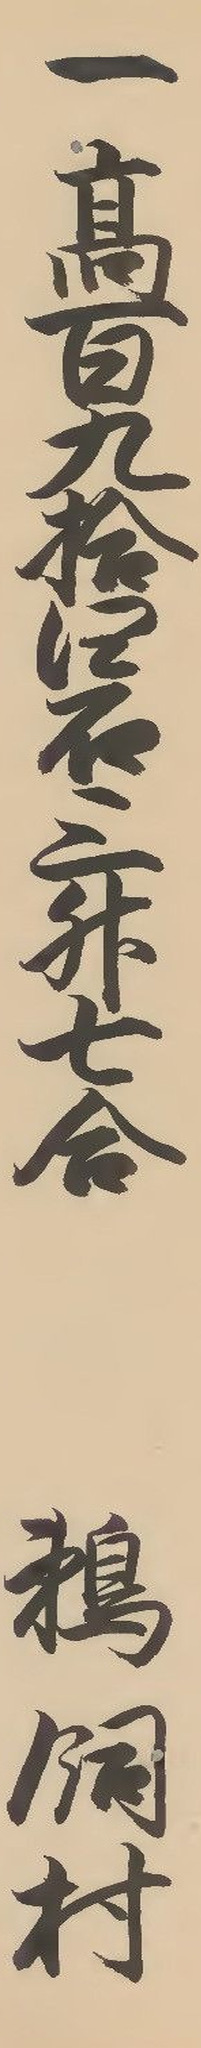一髙百九拾四石三斗七合鵜飼村
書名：播磨国郷帳
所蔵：国立公文書館 National Archives of Japan
